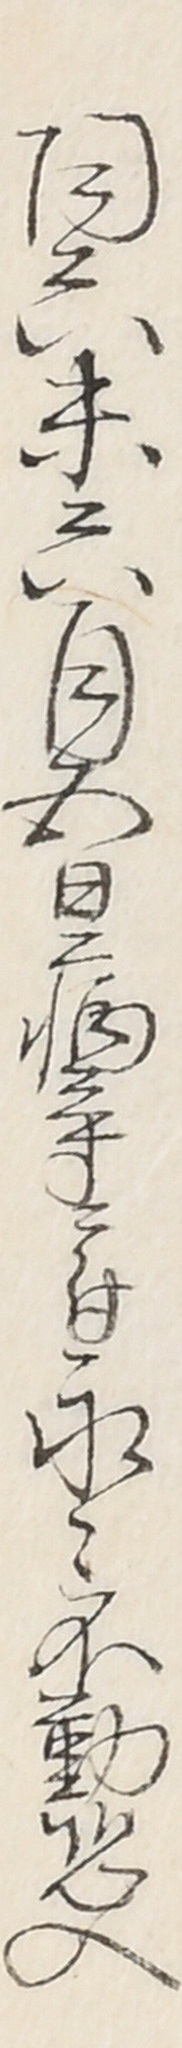一同六未六月五日病気ニ付永々不勤恐入
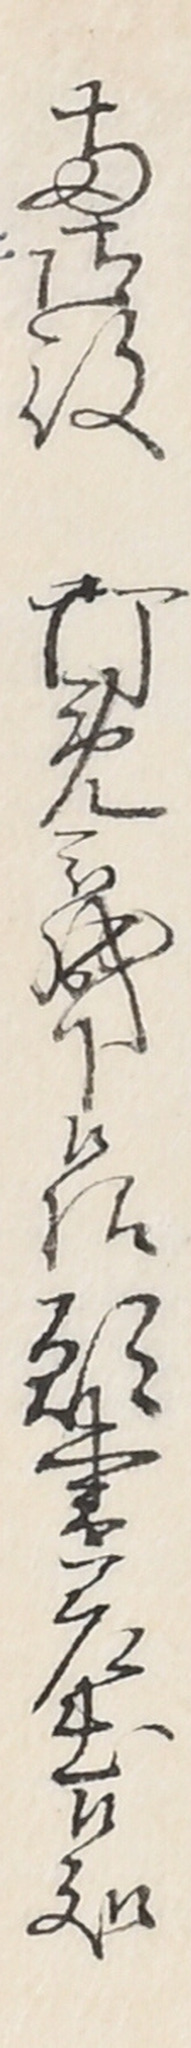両御役御免被成下候様願書差出候処
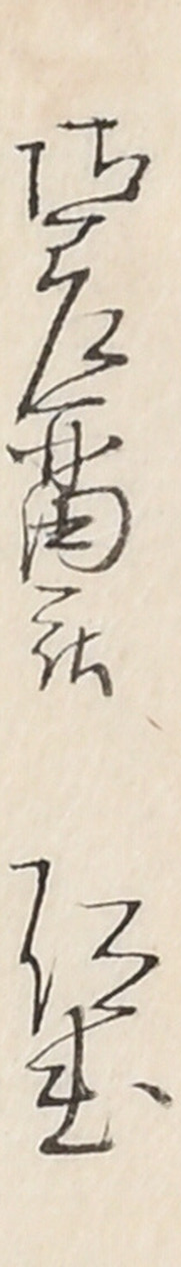御差留被仰出
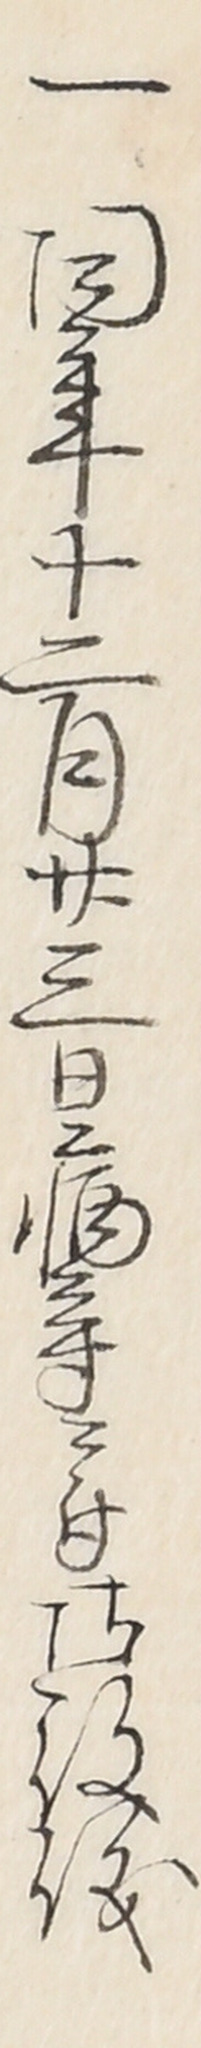一同年十二月廿三日病気ニ付御役儀
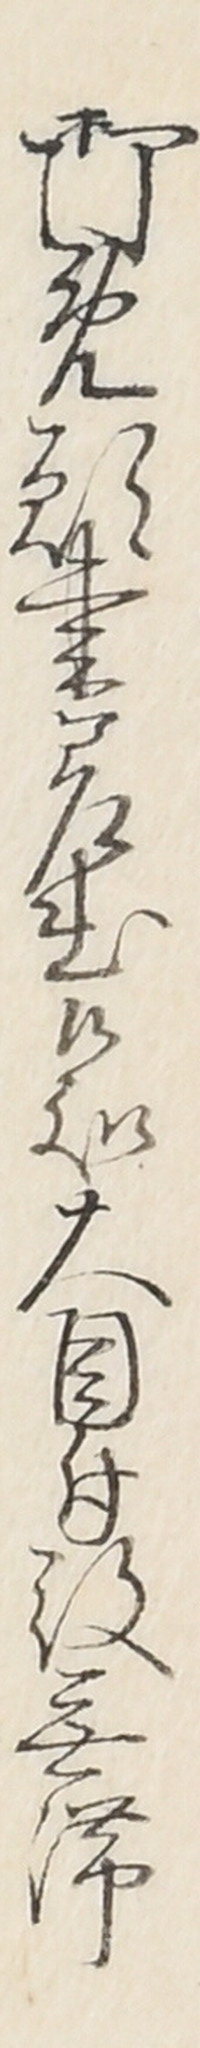御免願諸差出候処大目付役無滞
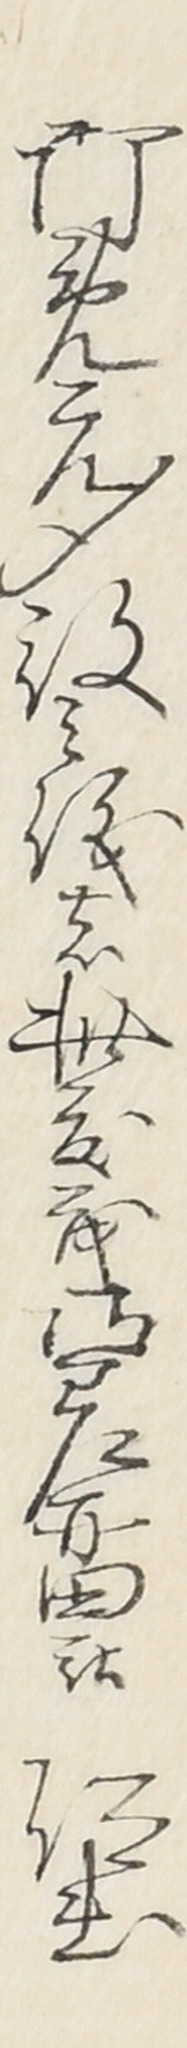御免元〆役之儀は此度も御差留被仰出
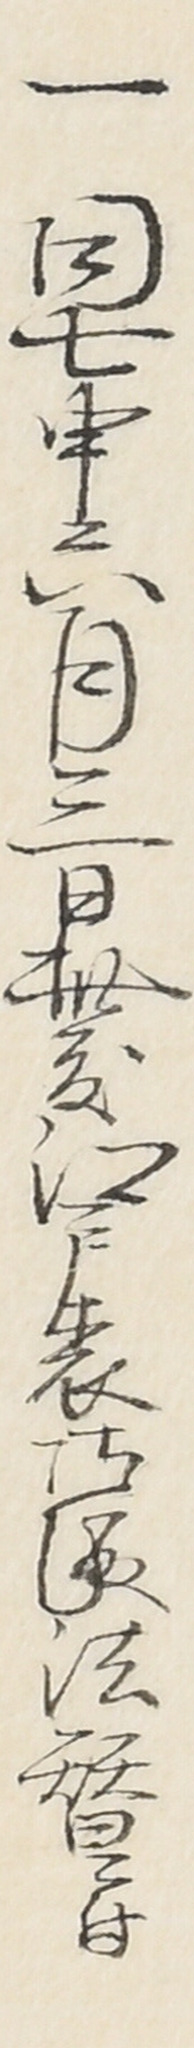一同七申六月三日此度江戸表御趣法替ニ付
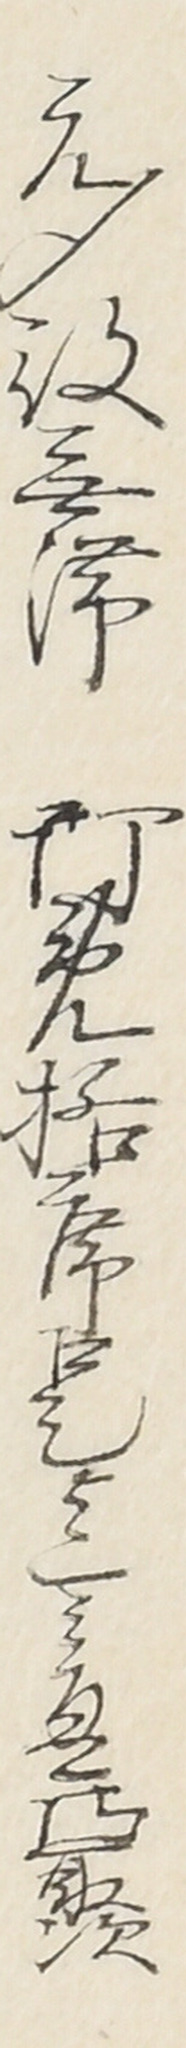元〆役無滞御免格席是迄之通御取次
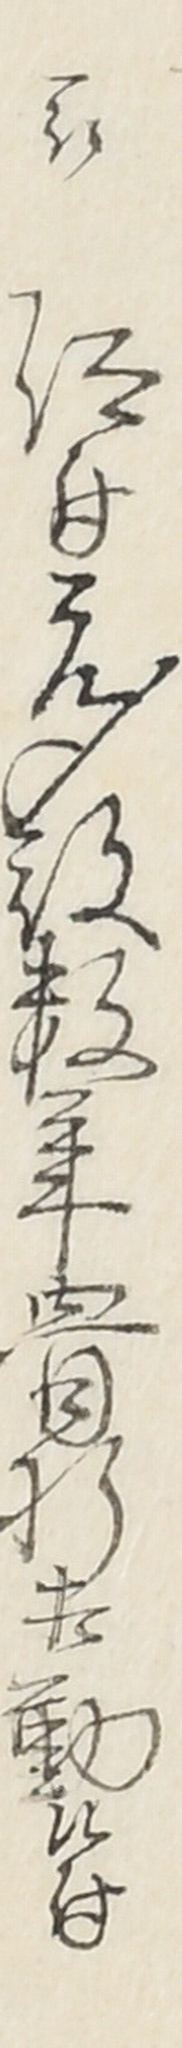被仰付元〆役数年骨折相勤被付
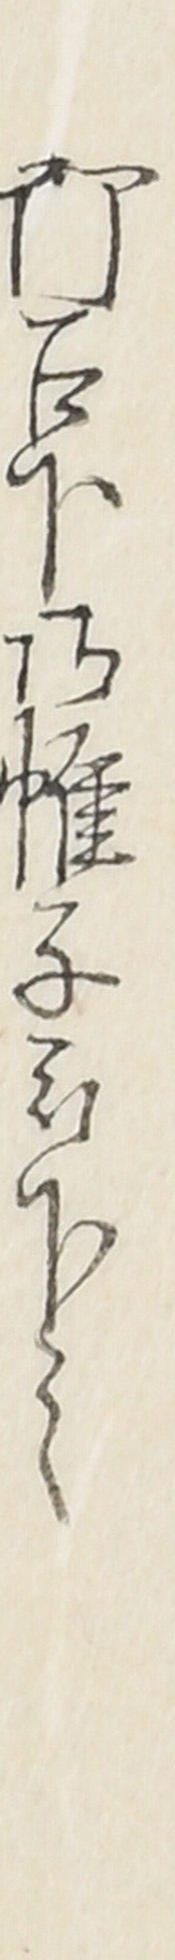御召下御帷子被下之
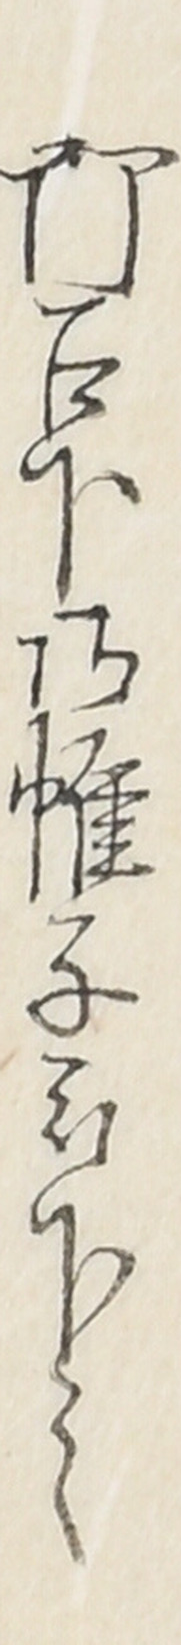御召下御帷子被下之
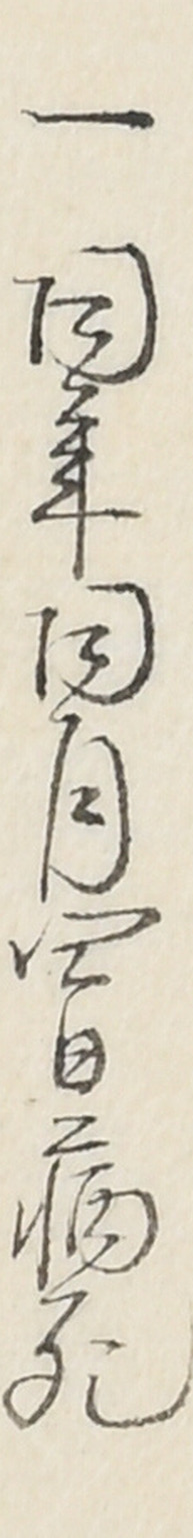一同年同月四日病死
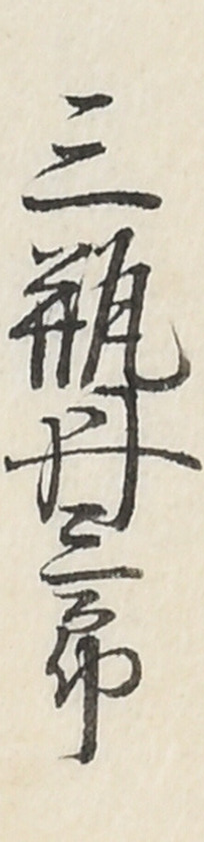三瓶丹三郎
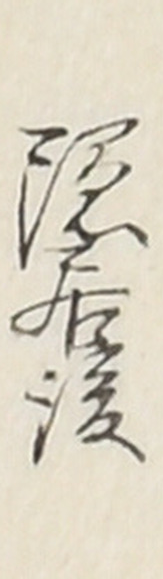隠居後
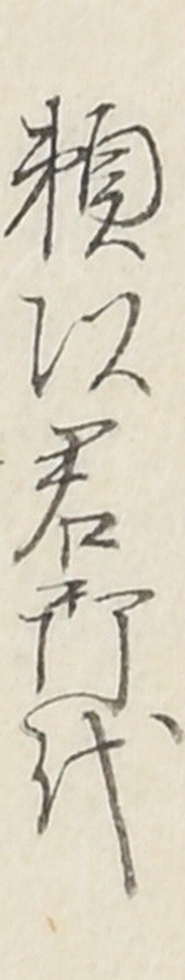頼寧君御代
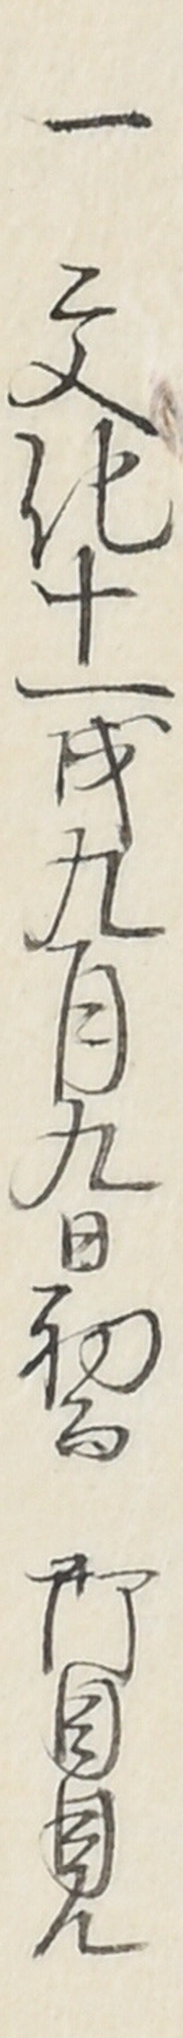一文化十一戌九月九日初而御目見
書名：給人諸士勤仕録（七）
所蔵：伊那市立高遠町図書館・合同会社AMANE
